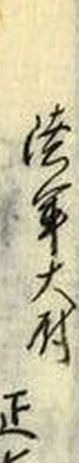陸軍大尉
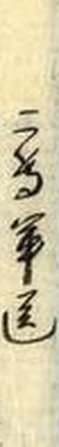二等軍医
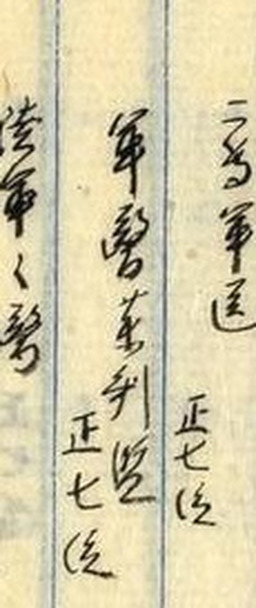軍医薬剤監

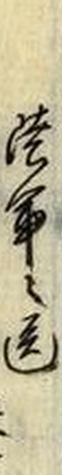陸軍々医
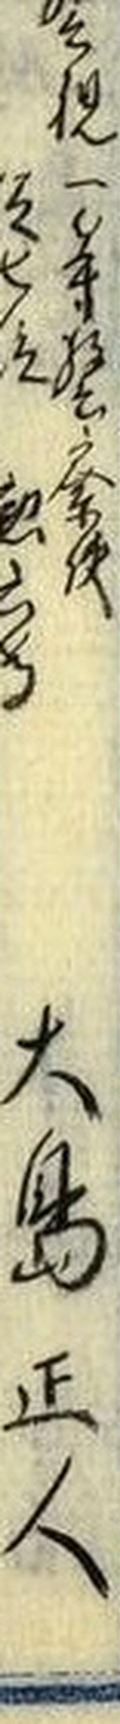従七位勲六等大島正人
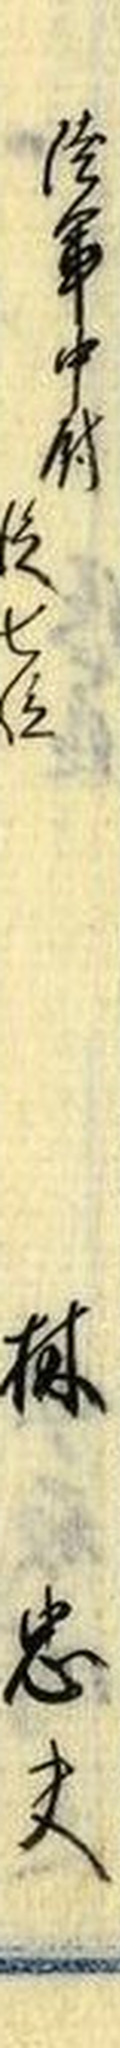従七位林忠夫
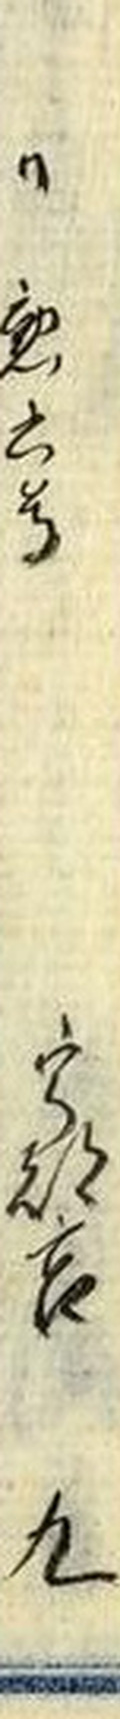同勲六等宇都宮九
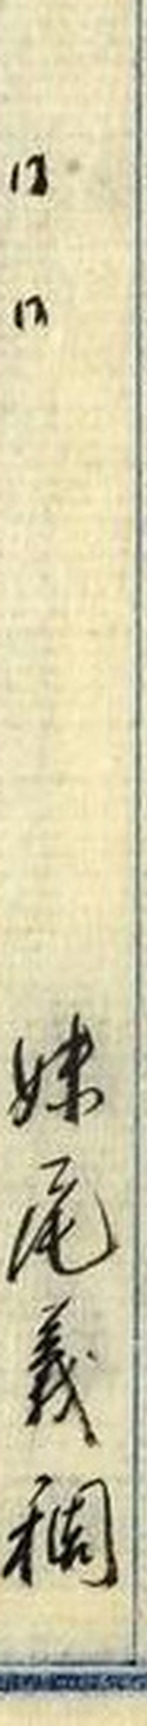同同妹尾義稠
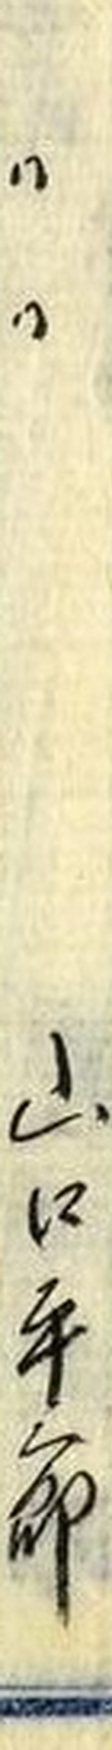同同山口午郎

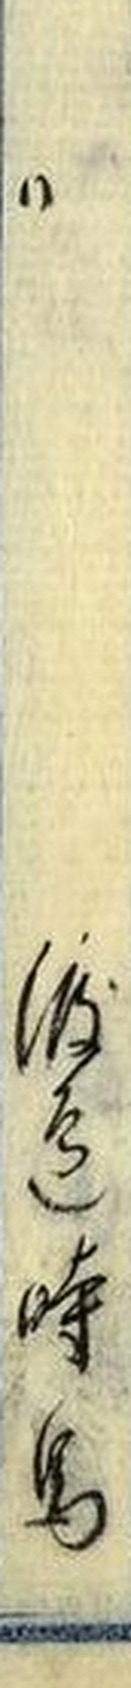同渡辺時馬
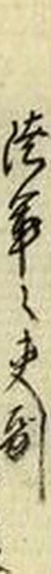陸軍同吏副
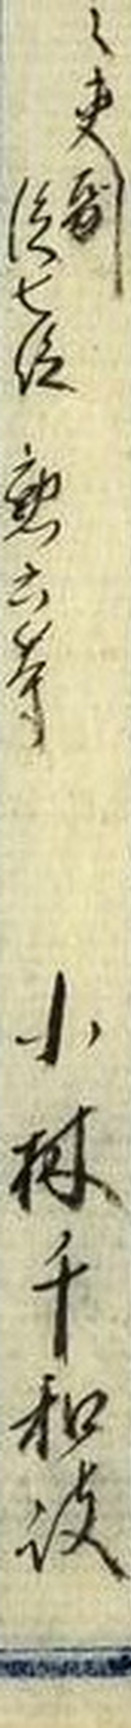従七位勲六等小林千和岐
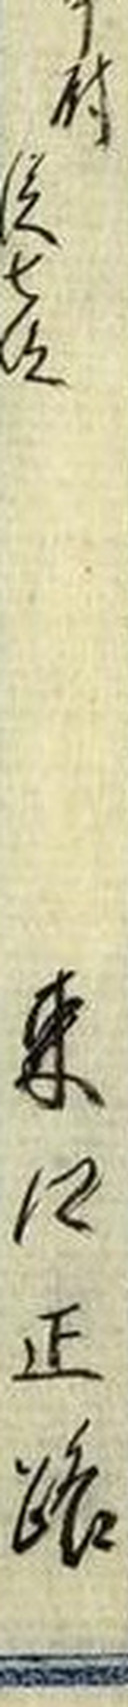従七位東郷正路
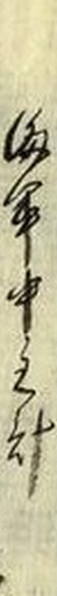海軍中主計
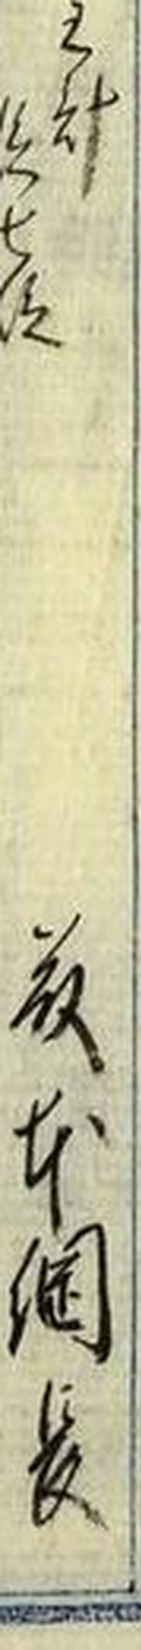従七位藤本綱長
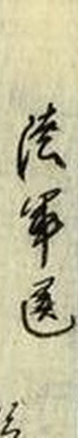陸軍医
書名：温古集 三巻
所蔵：福井県文書館 Fukui Prefectural Archives
